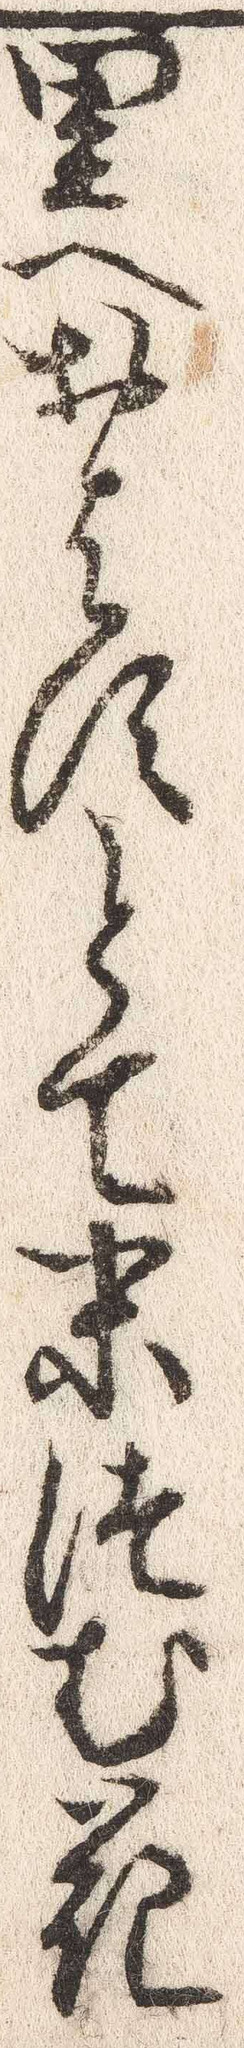里へおはすとて末つむ花
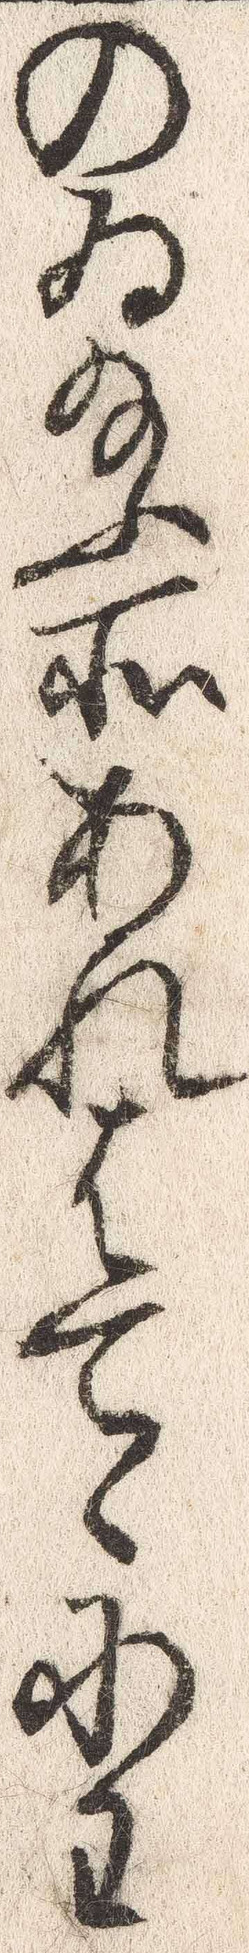のゐ給ふ所あれはてゝにわ

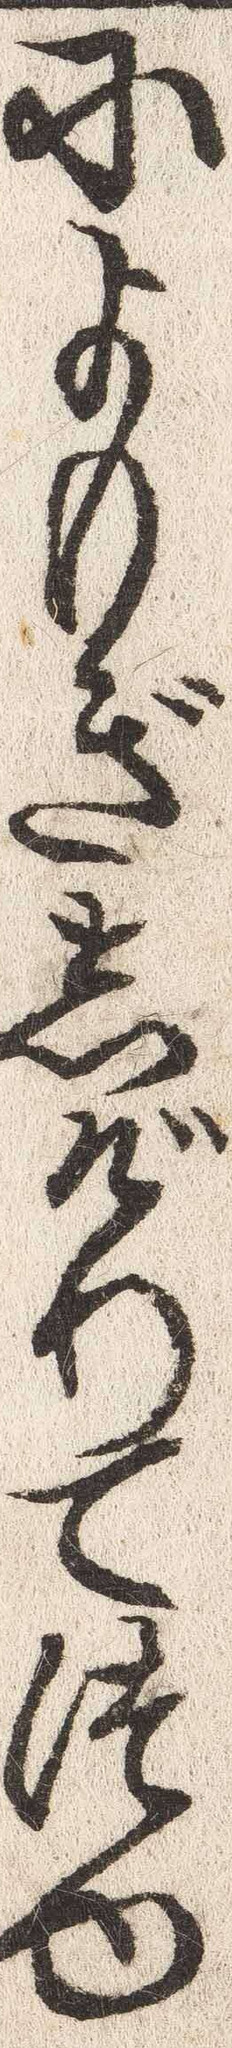によもぎしげりてつゆ
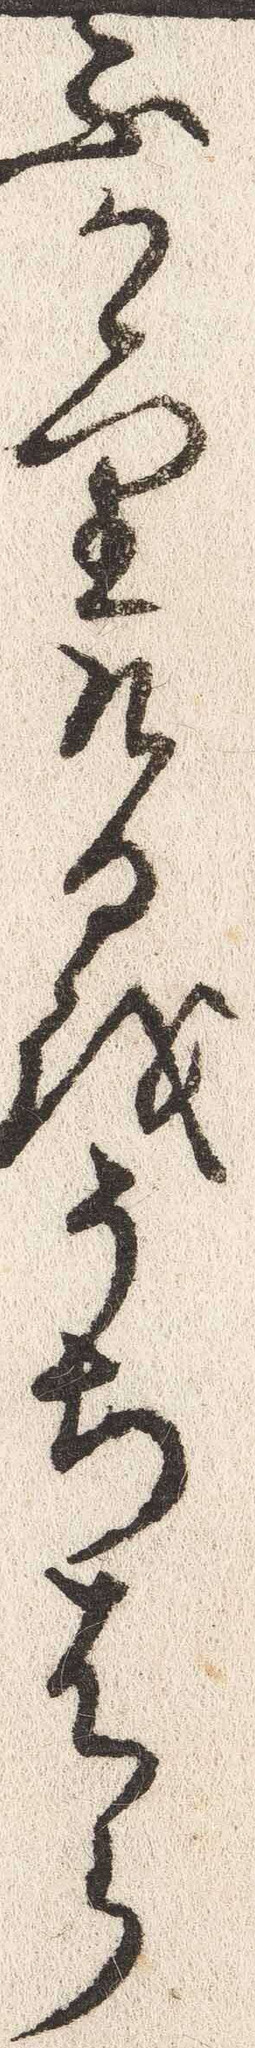ふかゝりけるをうちはら
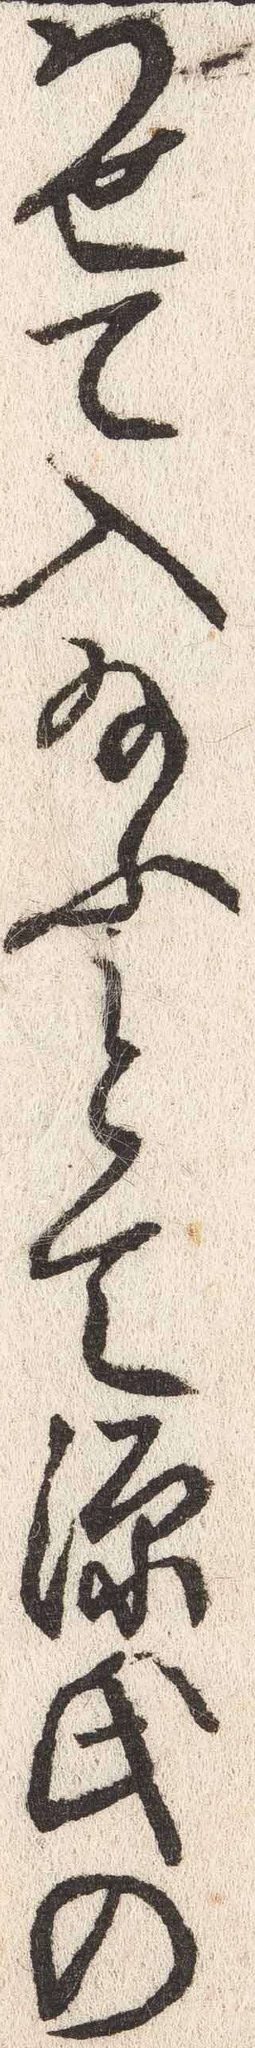はせて入給ふとて源氏の
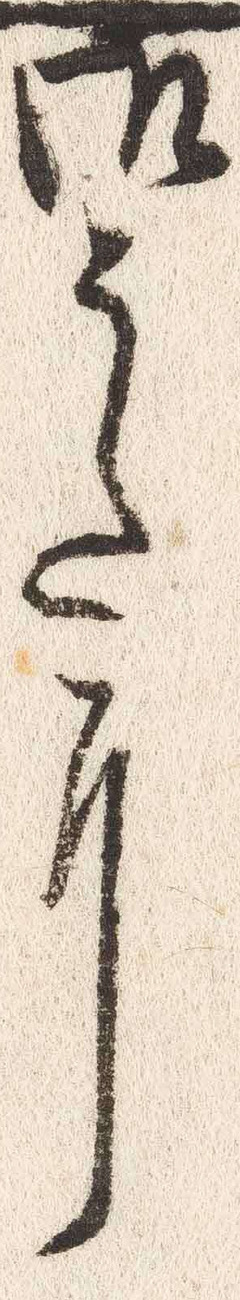御うたに
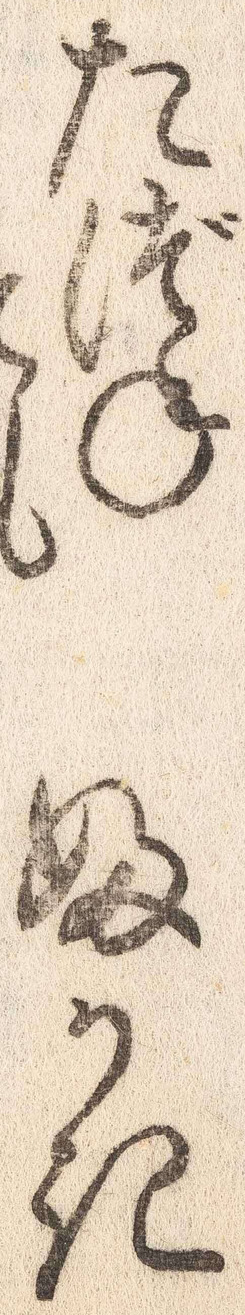たづねふかき
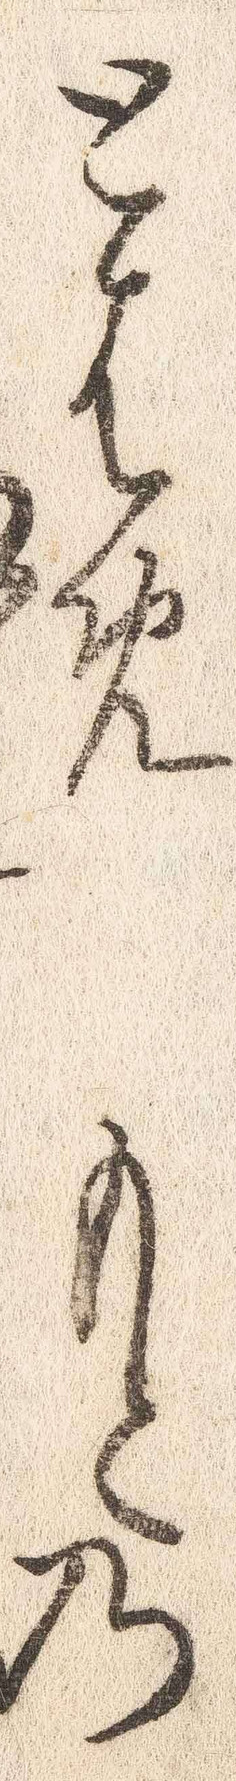とはめもとの

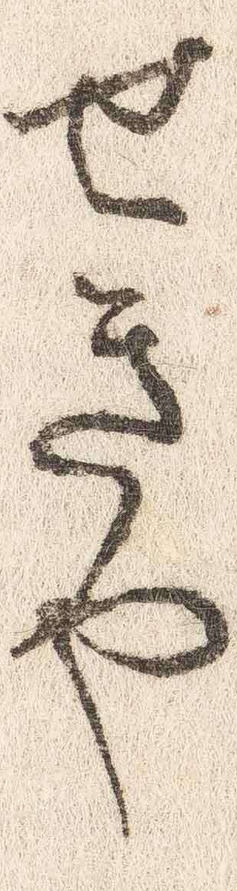せきや
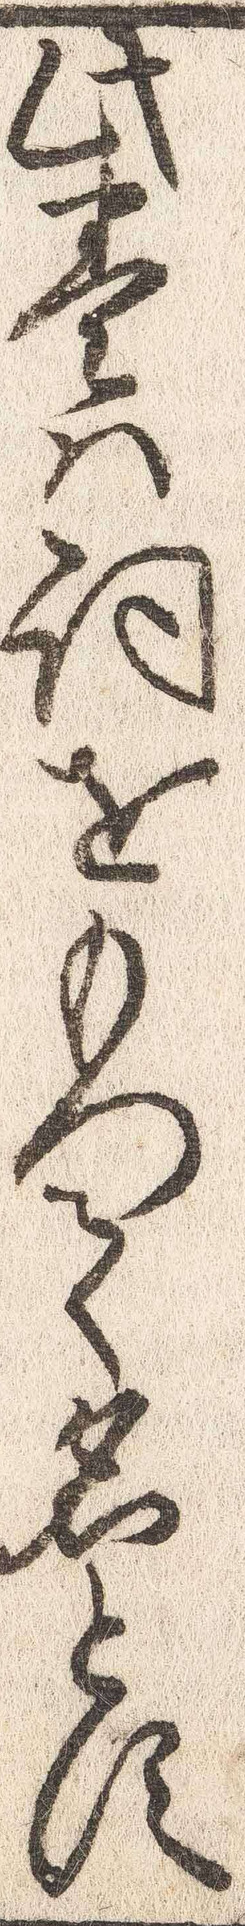此巻は詞をもつて名とす
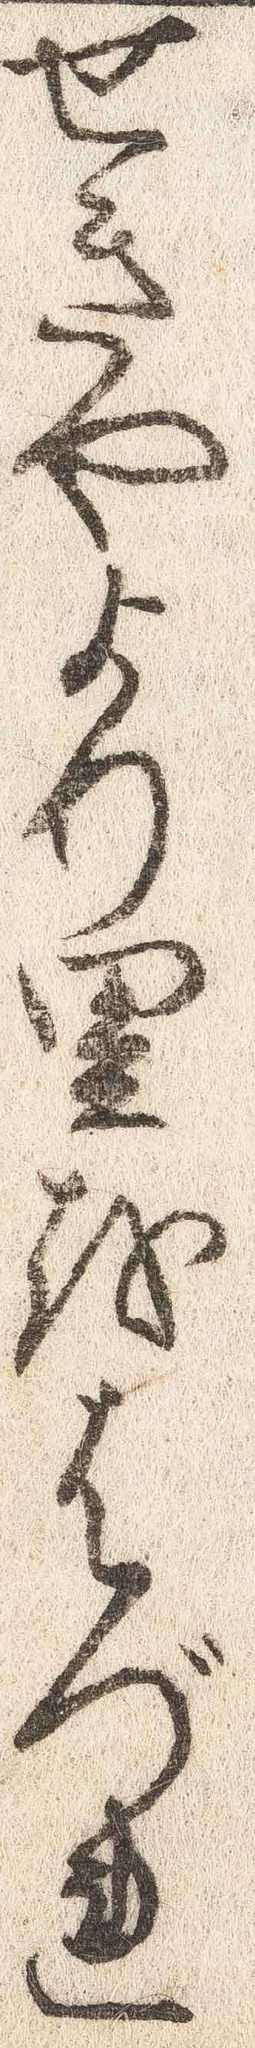せきやより里をはづれ
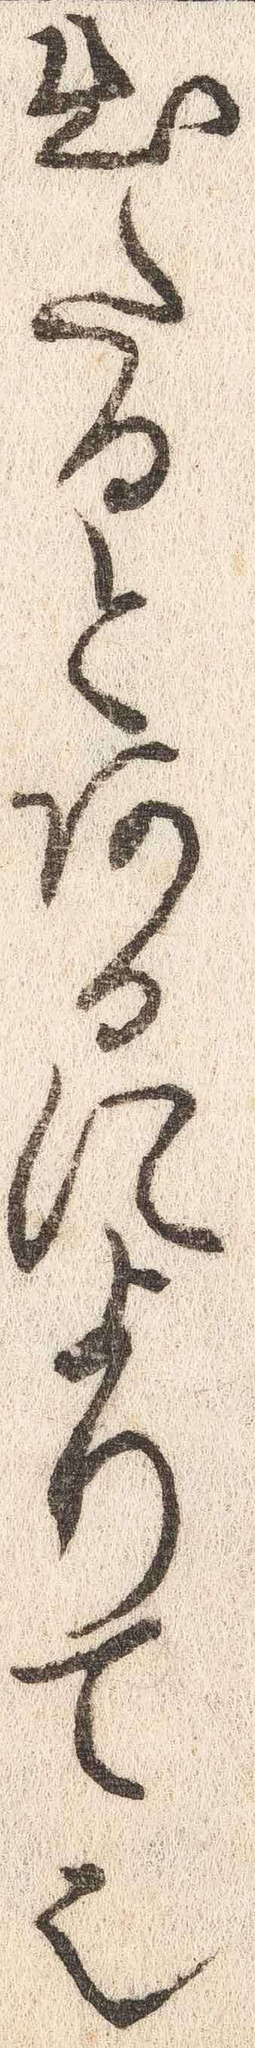出たるとあるによりて也
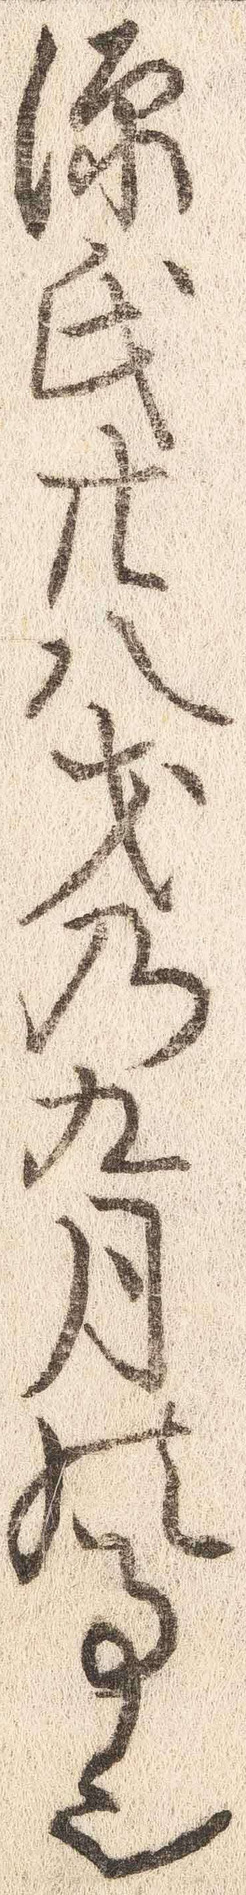源氏廿八才の九月の事也
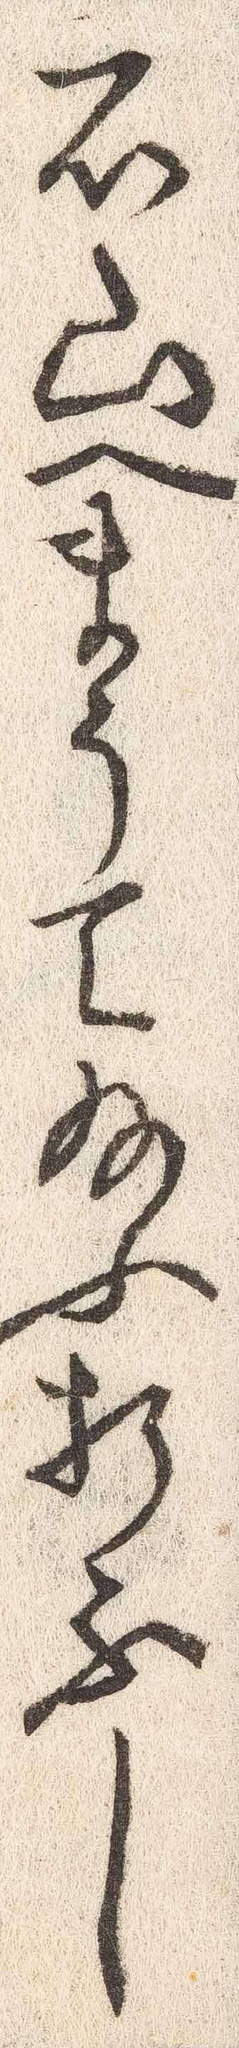石山へまうて給ふ折ふし
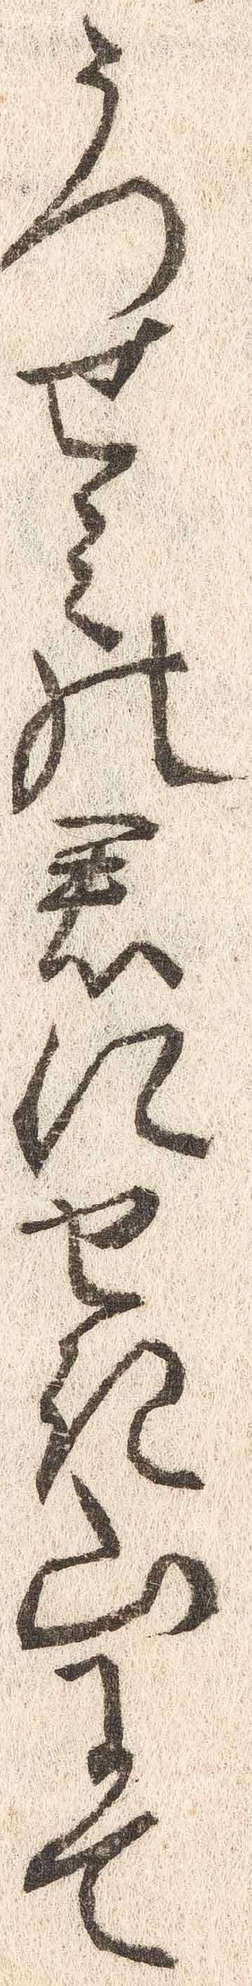うつせみの君にせき山にて
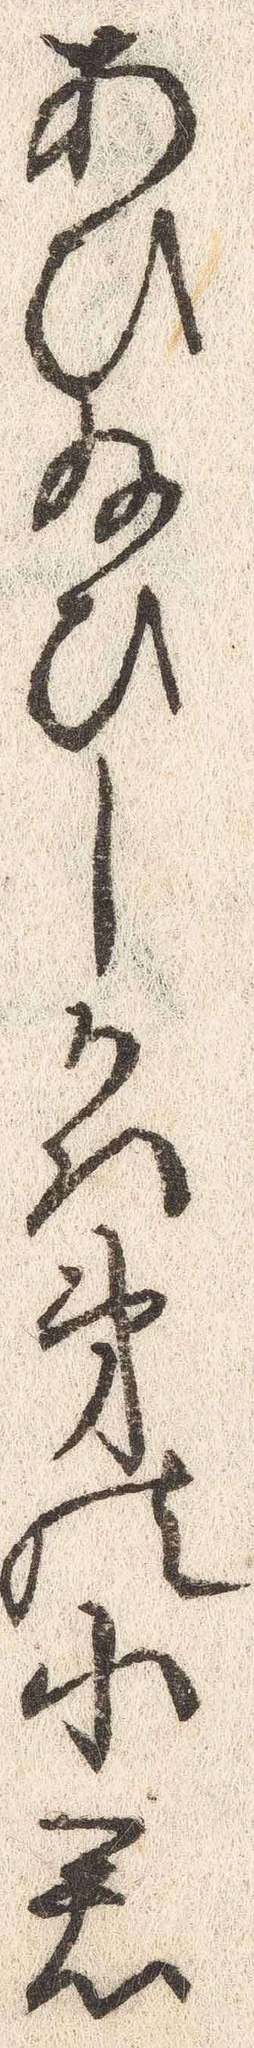あひ給ひしかは弟の小君
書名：源氏物語
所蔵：東京学芸大学附属図書館 国文学研究資料館
